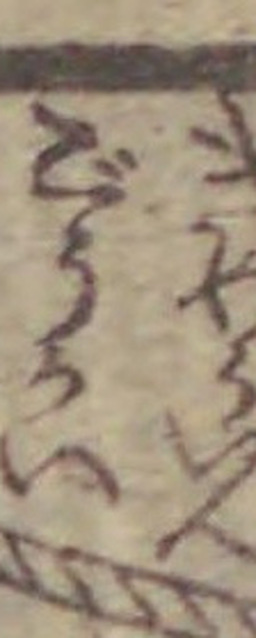ごうかい
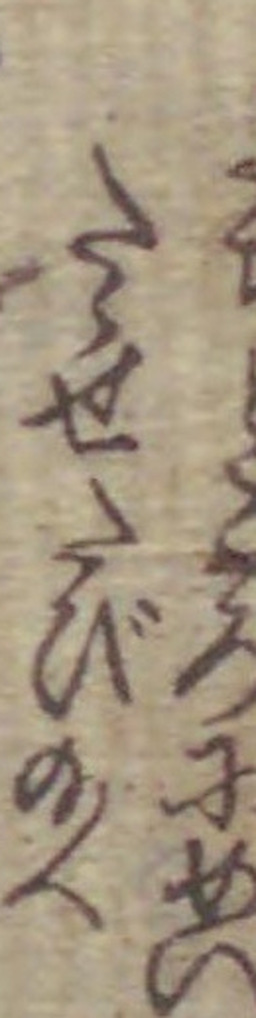たゝせたび給へ
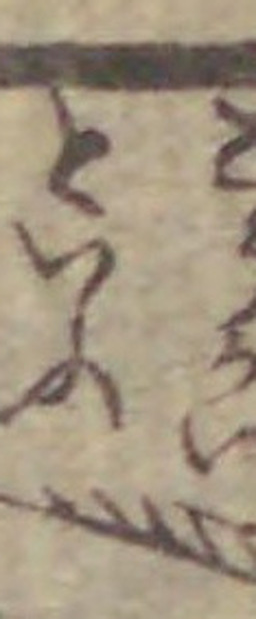といふ
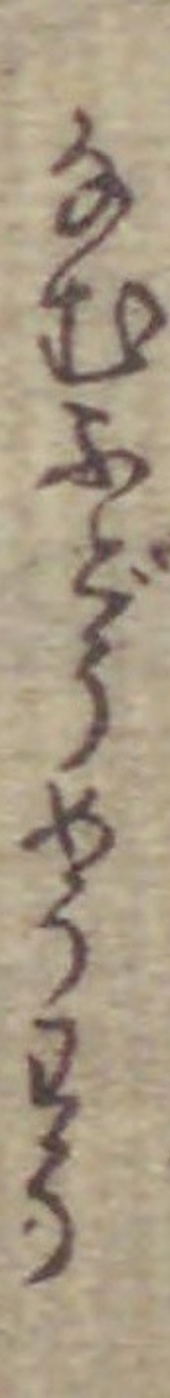なむふどうめうわう
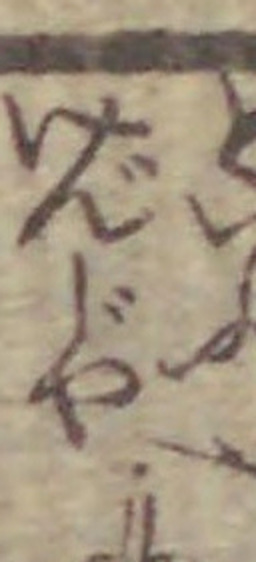げんじや
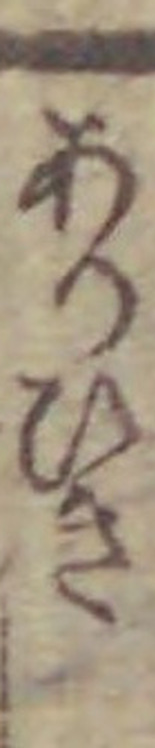ありひき
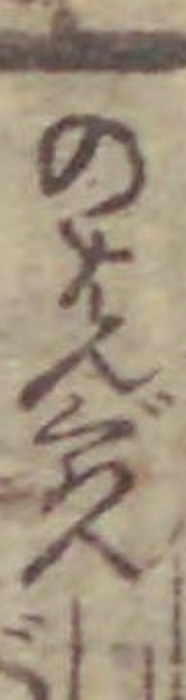のはんぐわん
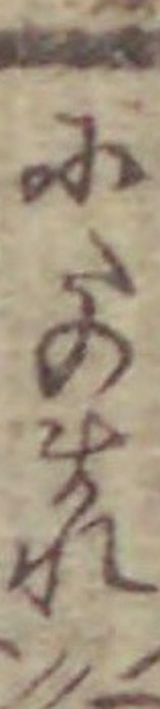にたのまれ
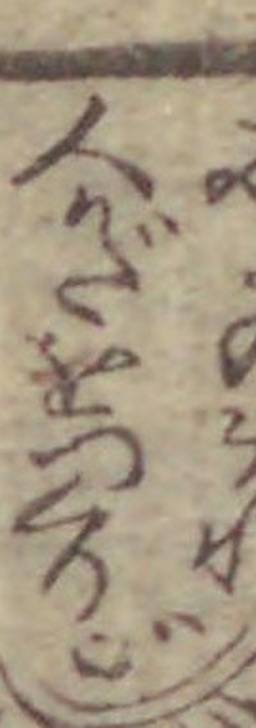人がたをつくり
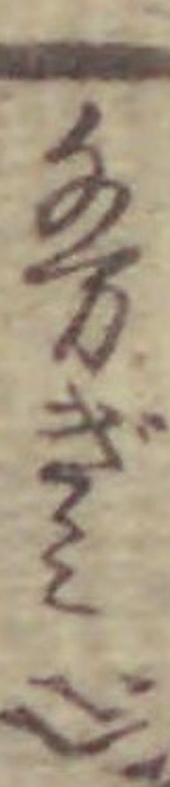千万ぎみ
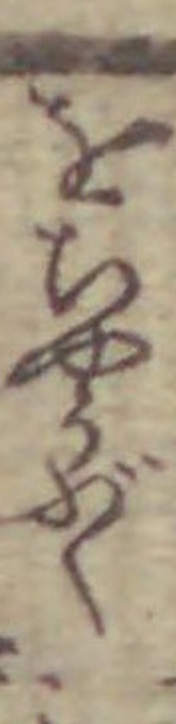をちやうぶく
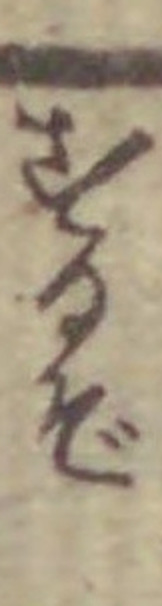するぞ
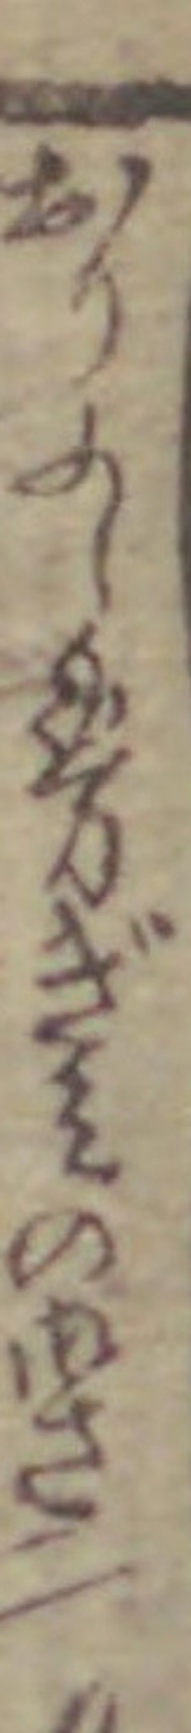おりふし千万ぎみの御さ
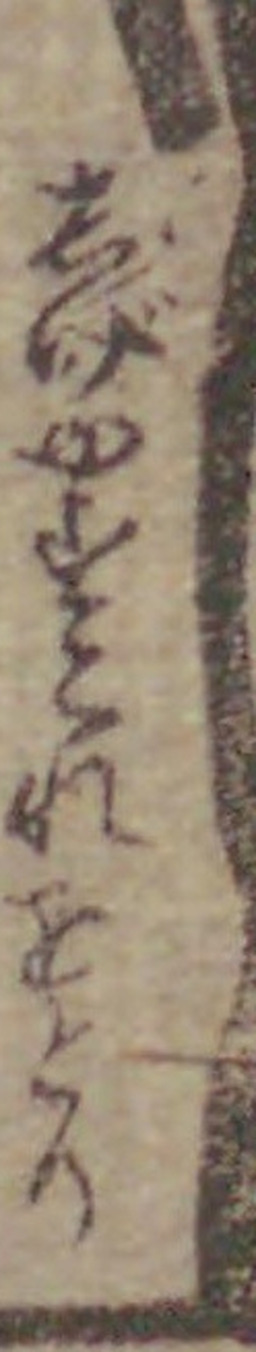しげやすこれをとり
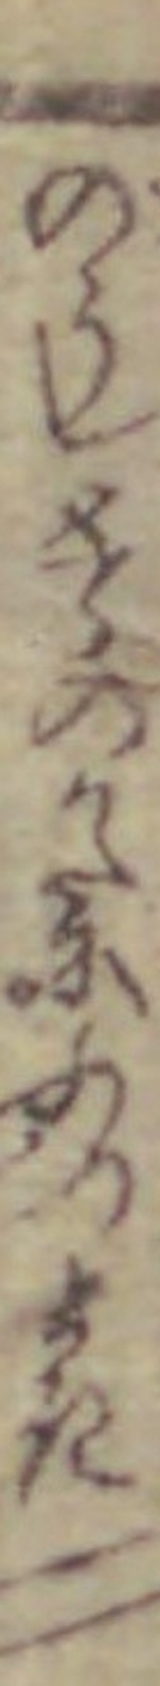のうしとらのかたにふりよき
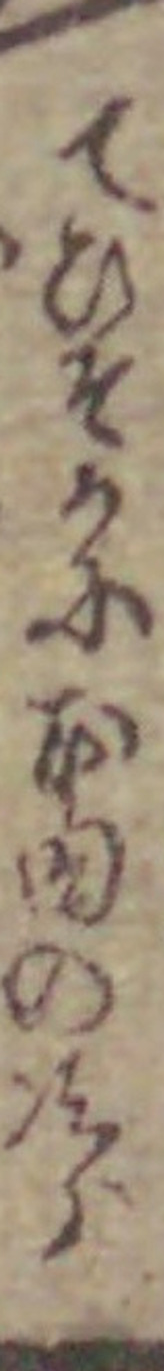てひそかに本田の次郎
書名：鎌倉山紅葉浮名
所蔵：国立国会図書館 National Diet Library, JAPAN
